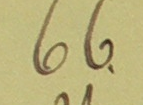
66
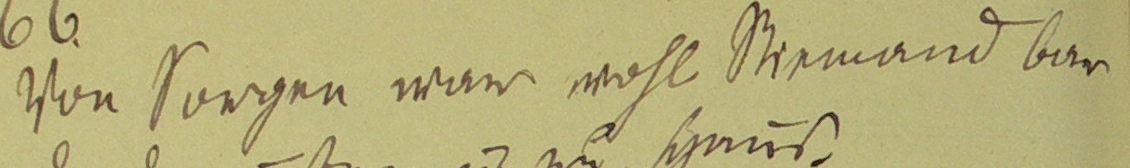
Von Sorgen war wohl niemand bar
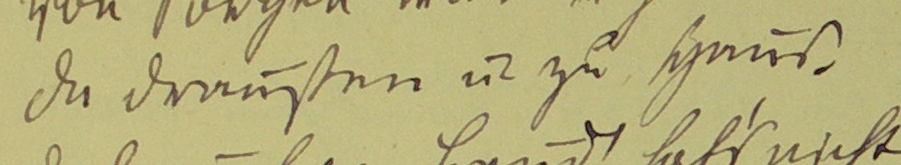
Da draußen und zu Hause
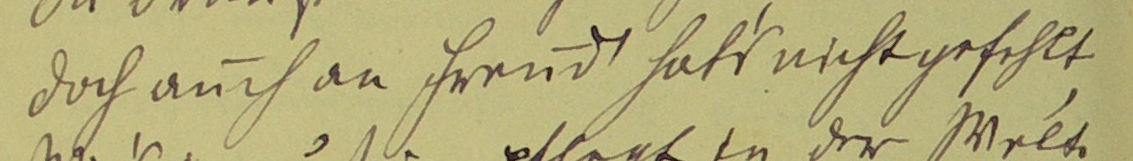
Doch auch an Freud hat´s nicht gefehlt
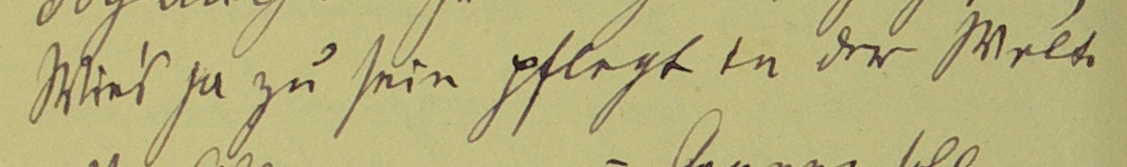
Wies ja zu sein geflegt in der Welt
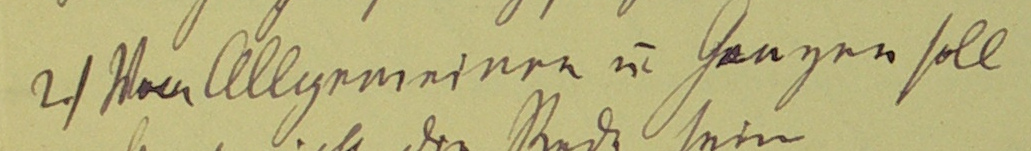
2) Vom Allgemeinen und Ganzen soll
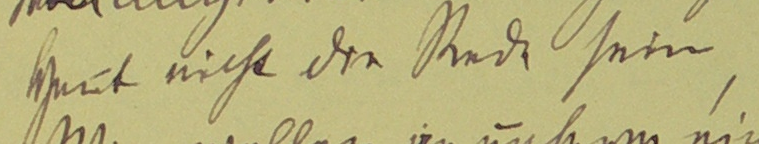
Heut nicht die Rede sein
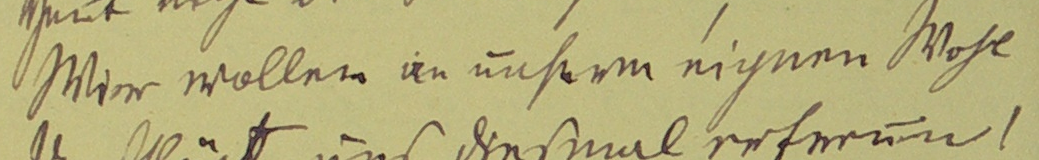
Wir wollen an unserem eigenen Wohl
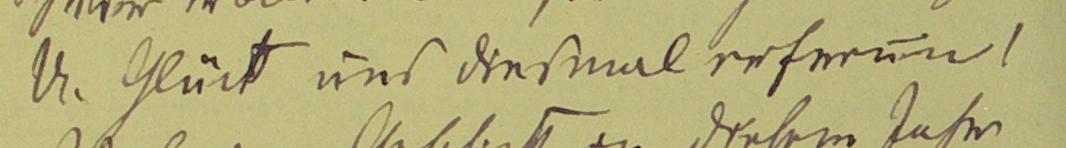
u. Glück
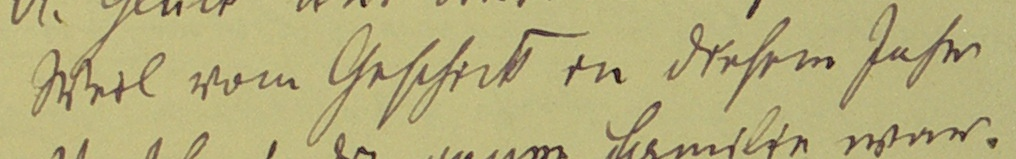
Geschick in diesem Jahr
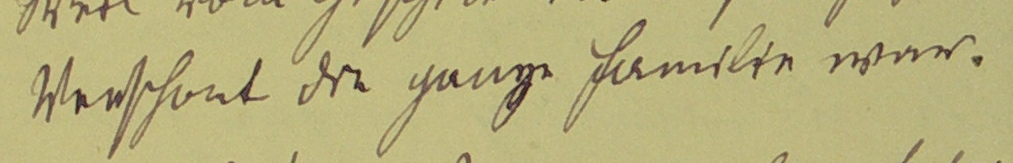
Verschont die ganze Familie war.
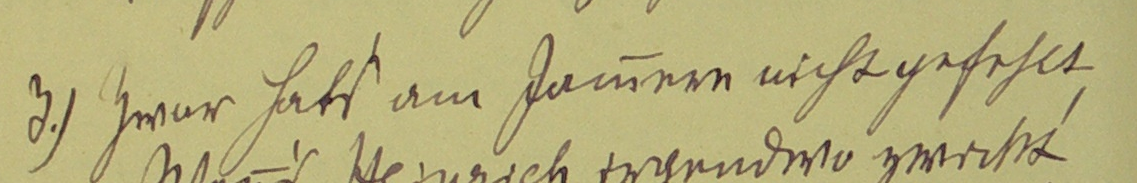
3) Zwar hat`s am Jammern nicht gefehlt
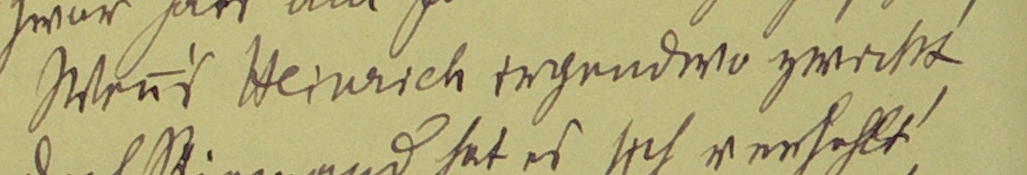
Wenn Heinrich irgendwo gezwickt
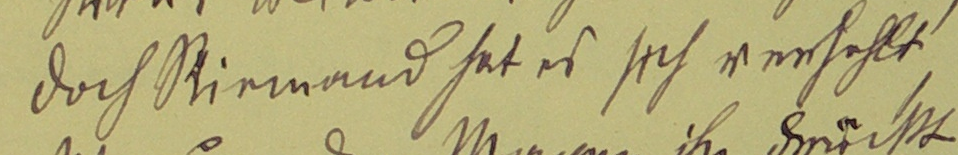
Doch niemand hat es sich verhehlt
